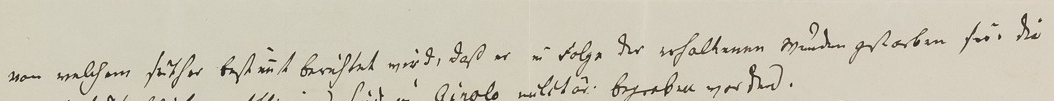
von welchem seither bestimmt berichtet wird, daß er in Folge der erhaltenen Wunden gestorben sei. Die
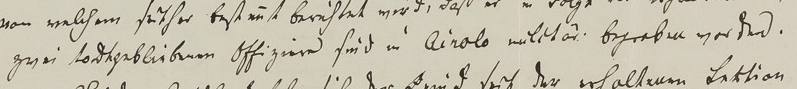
zwei todtgebliebenen Offiziere sind in Airolo militär. begraben worden.
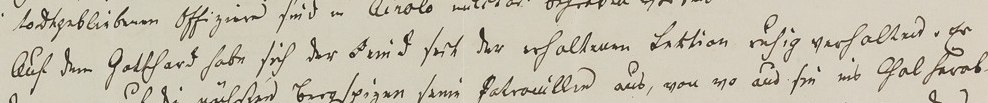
Auf dem Gotthard habe sich der Feind seit der erhaltenen Lektion ruhig verhalten. Er
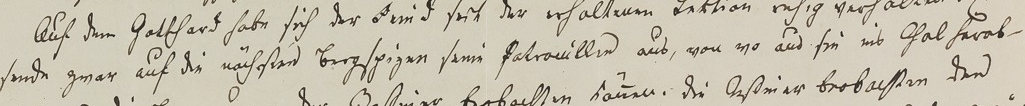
sende zwar auf die nächsten Bergspizen seine Patrouillen aus, von wo aus sie ins Thal herab-
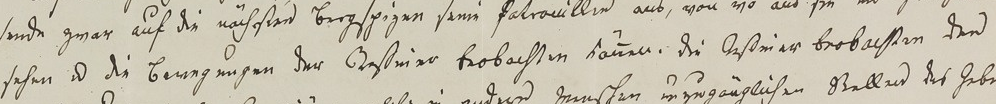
sehen u die Bewegungen der Tessiner beobachten können. Die Tessiner beobachten den
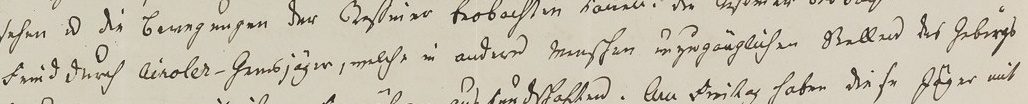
Feind durch Airoler-Gemsjäger, welche in andern Menschen unzugänglichen Stellen des Gebirgs
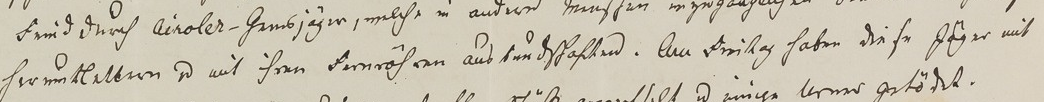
herumklettern u mit ihren Fernröhren auskundschaften. Am Freitag haben diese Jäger mit
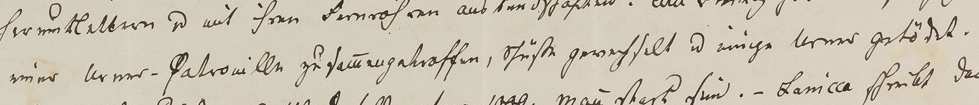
einer Urner-Patrouille zusammengetroffen, Schüsse gewechselt u einige Urner getödet.
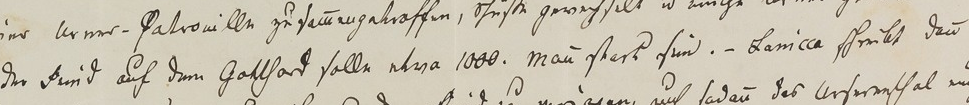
Der Feind auf dem Gotthard solle etwa 1000. Mann stark sein. – Lanicca schreibt dann
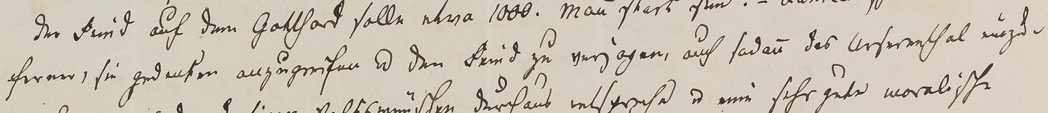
ferner, sie gedenken anzugreifen u den Feind zu verjagen, auch sodann das Urserenthal einzu-
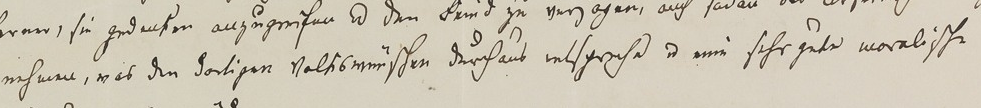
nehmen, was den dortigen Volkswünschen durchaus entspreche u eine sehr gute moralische
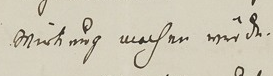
Wirkung machen würde.
